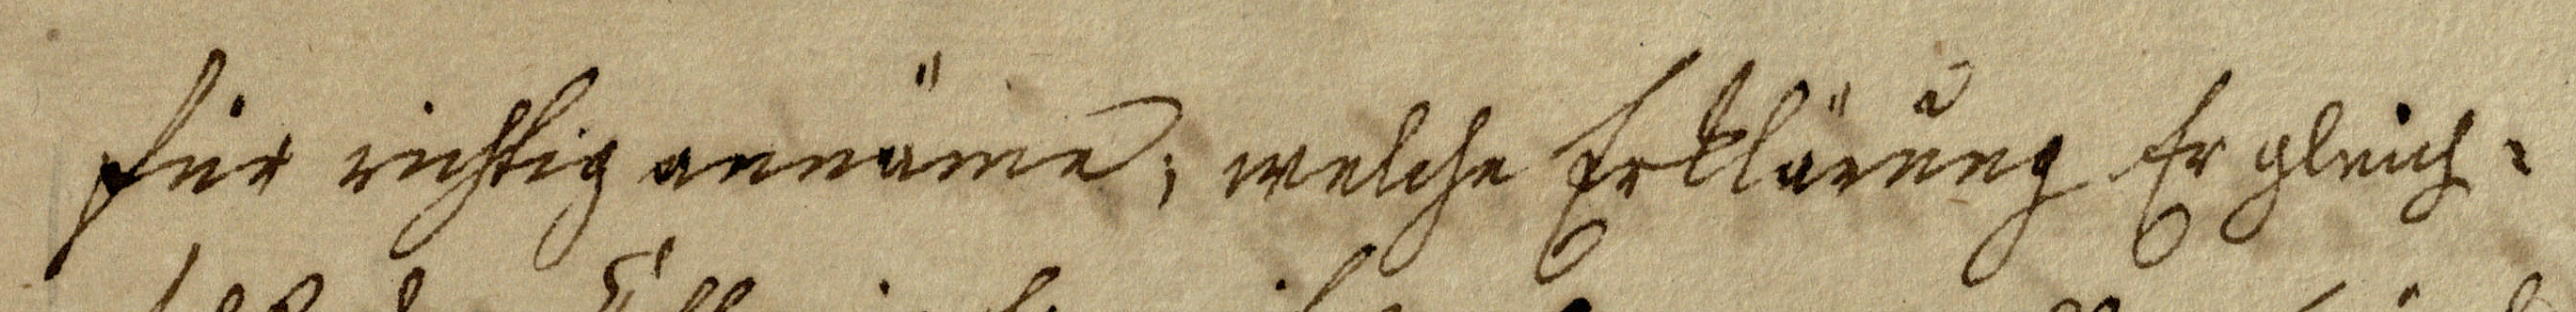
für richtig annäme, welche Erklärung Er gleich¬
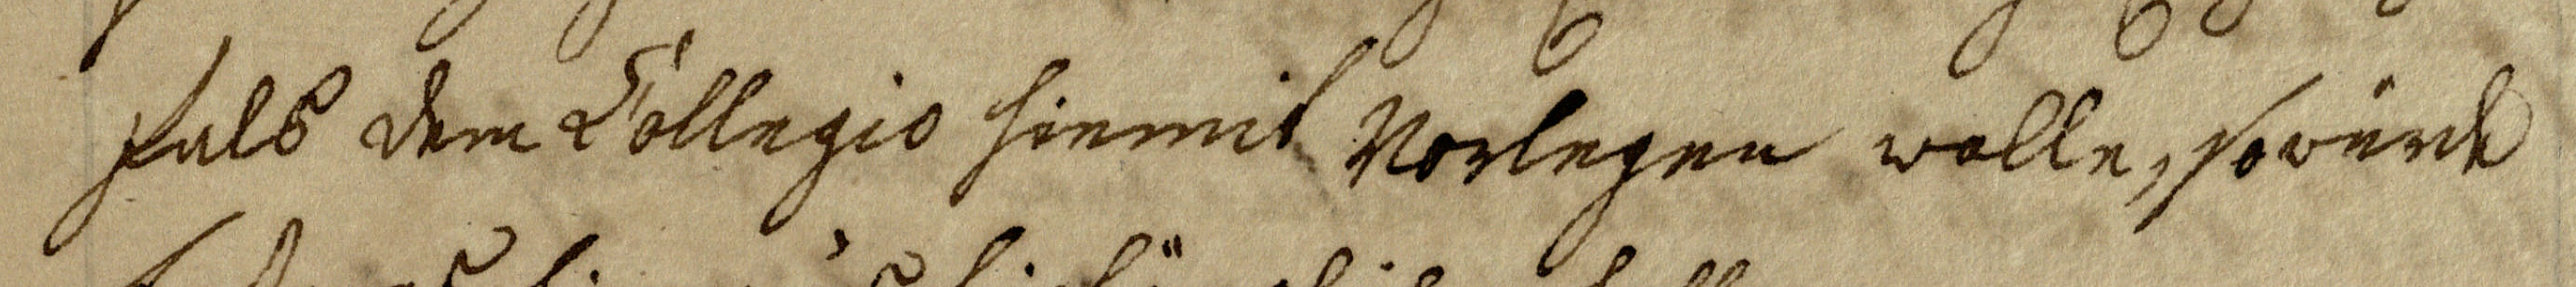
fals dem Collegio hiemit vorlegen wolle, so würde
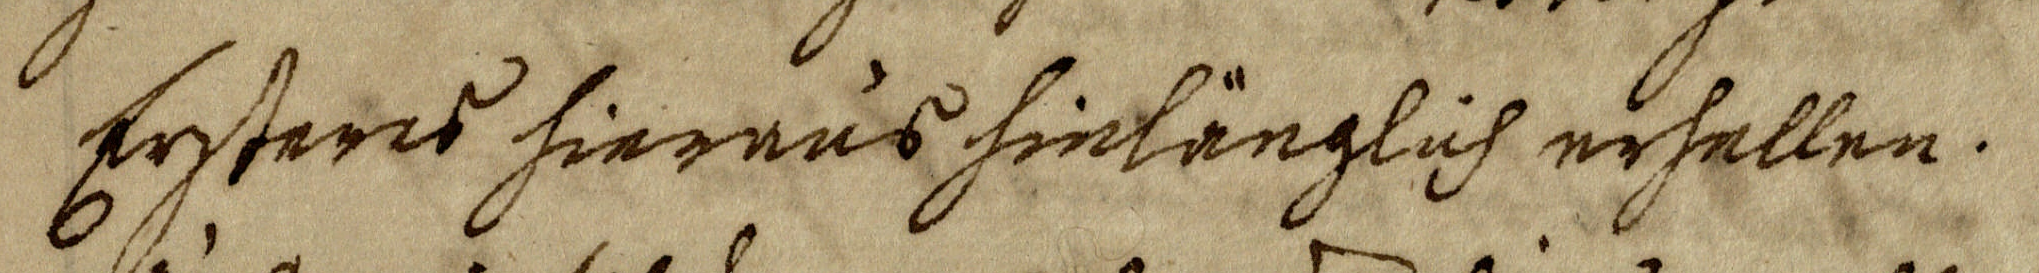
Ersteres hieraus hinlänglich erhellen.
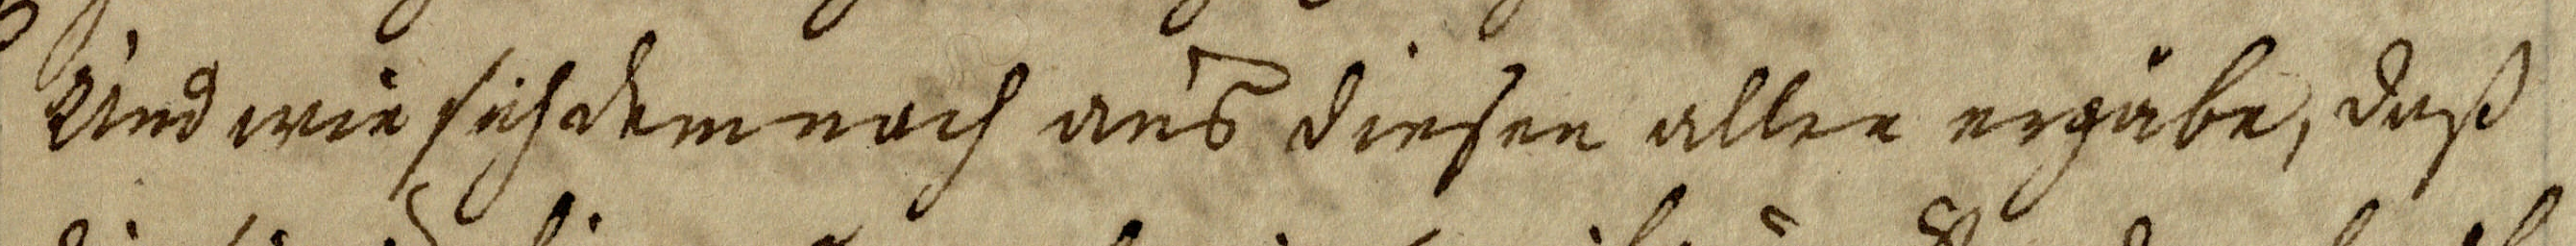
Und wie sich demnach aus diesen allen ergäbe, daß
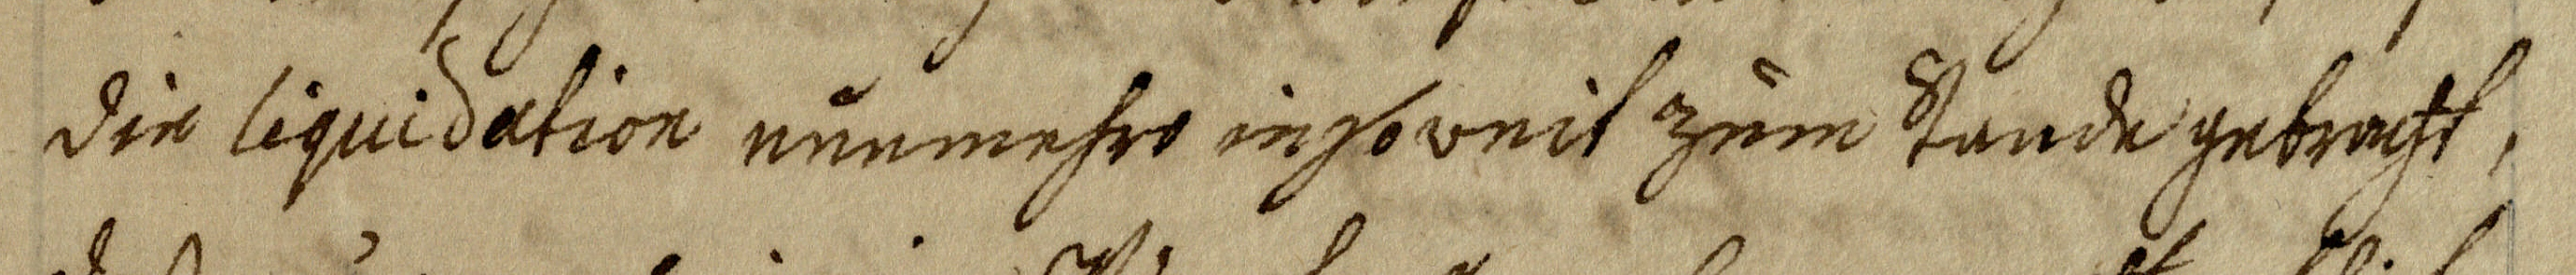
die liquidation nunmehro in soweit zum Stande gebracht,
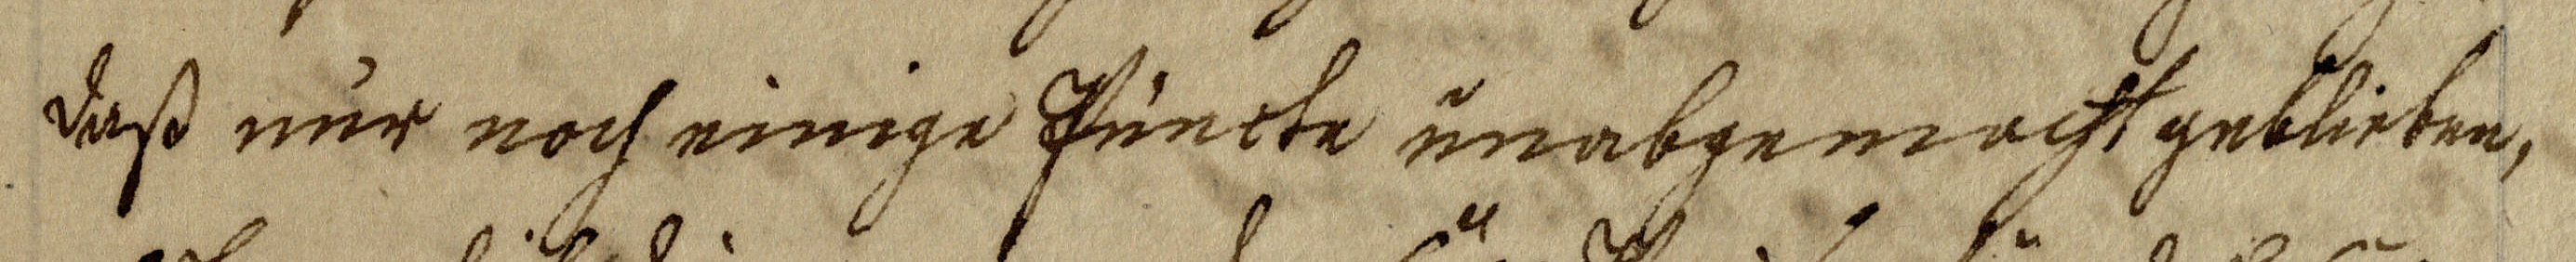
daß nur noch einige Puncte unabgemacht geblieben,
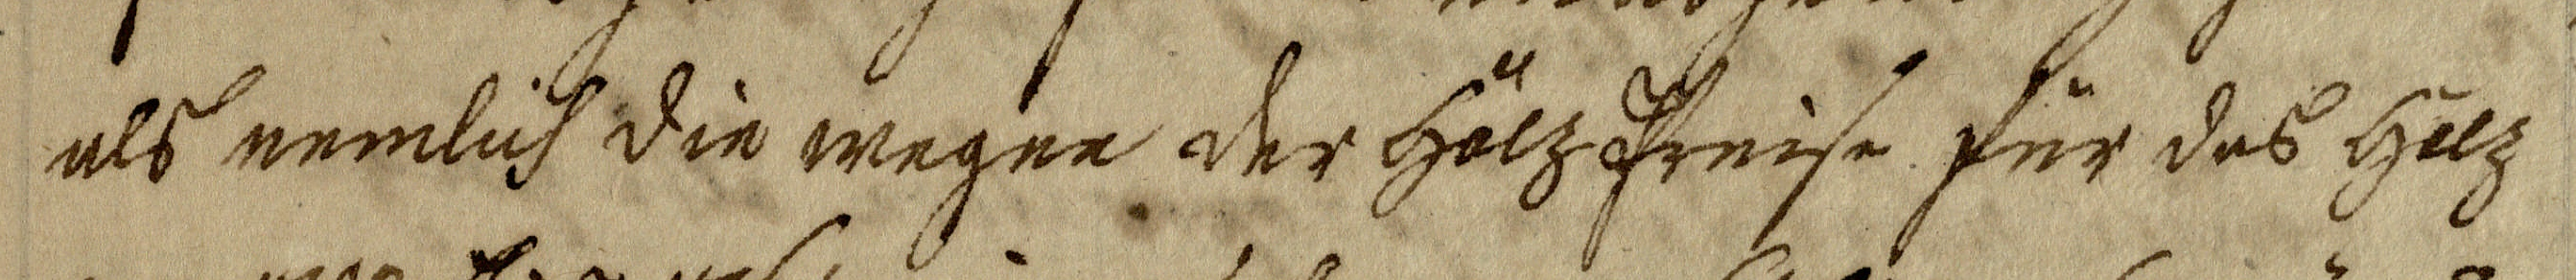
als nemlich die wegen der Holz Preise für des Holz
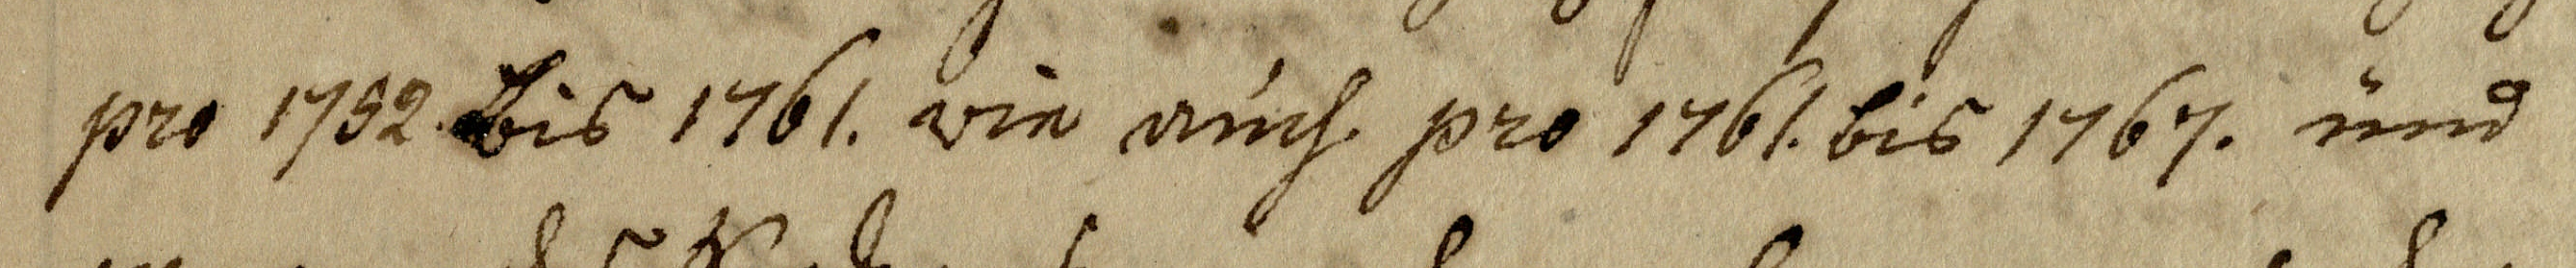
pro 1752 bis 1761, wie auch pro 1761. bis 1767. und
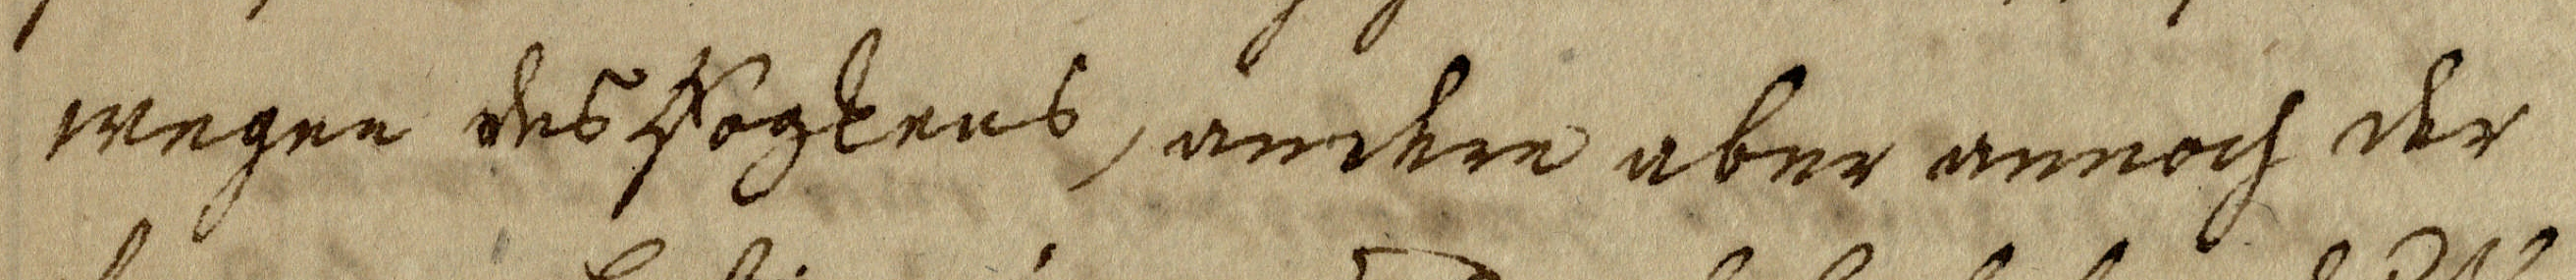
wegen des Rogkens, andere aber annoch der
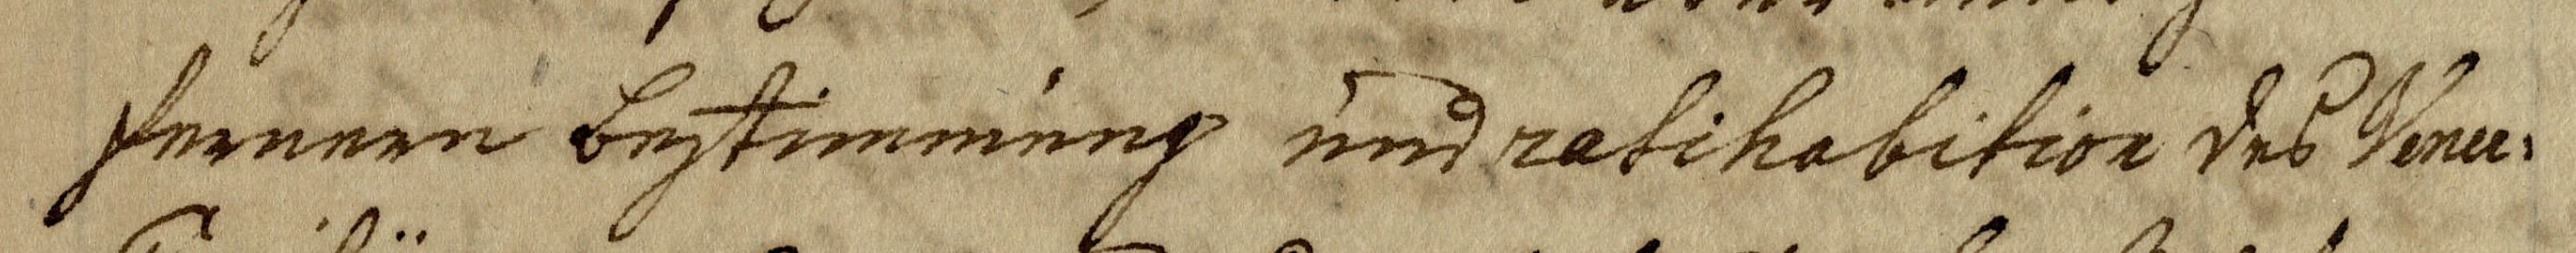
fernern Bestimmung und ratihabition des Vener.
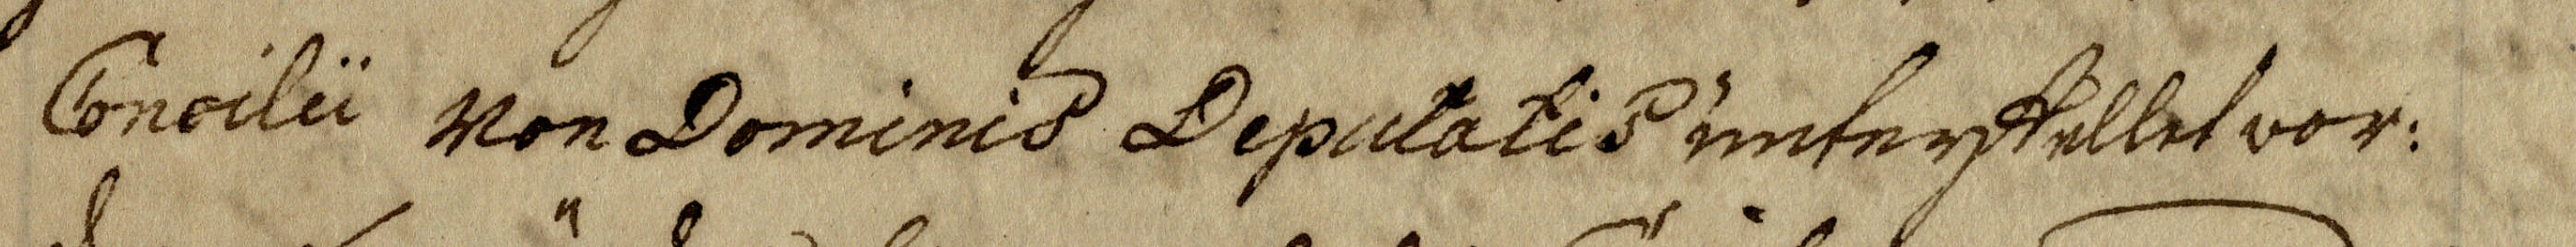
Concilii von Dominis Deputatis unterstellet wor¬
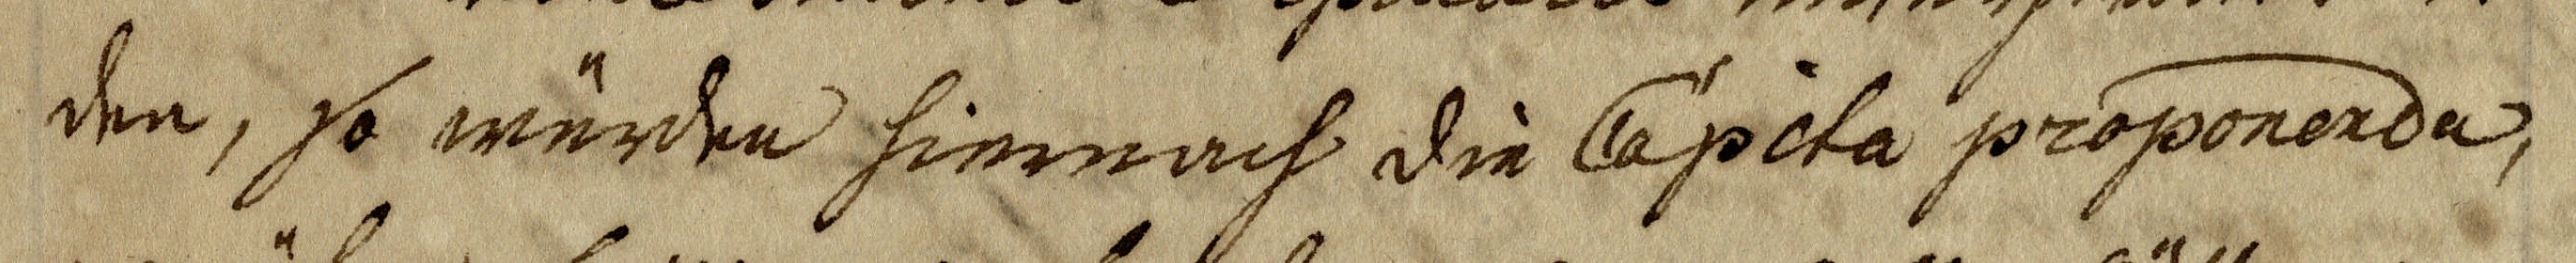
den, so würden hiernach die Capita proponenda,
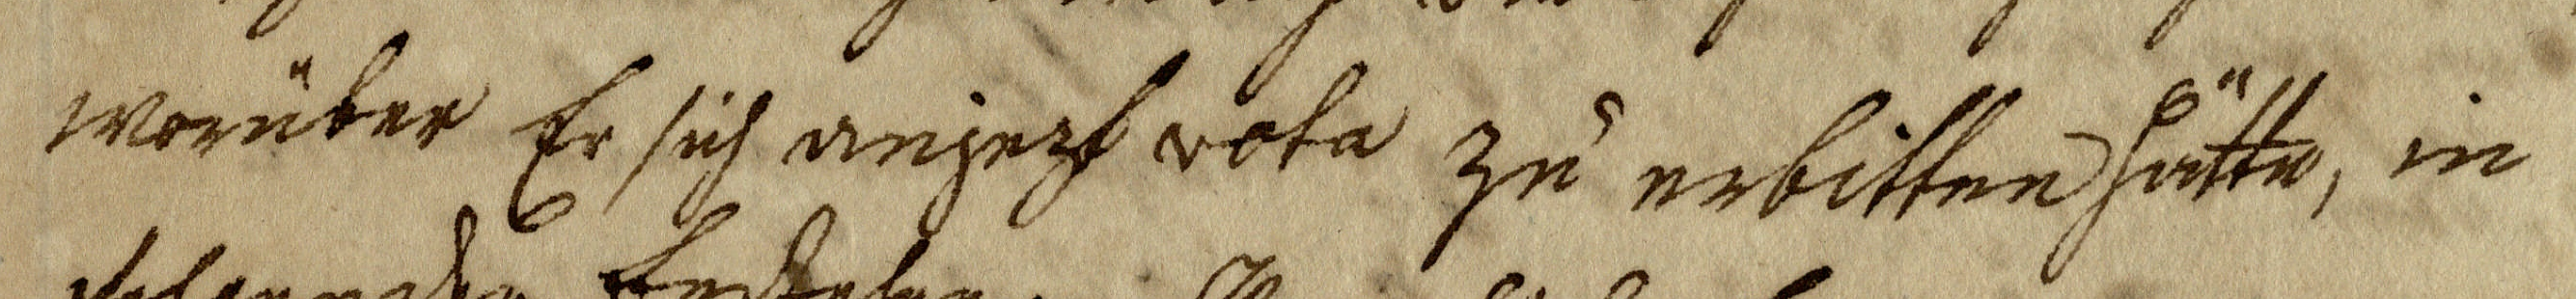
worüber Er sich anjetzt vota zu erbitten hätte, in
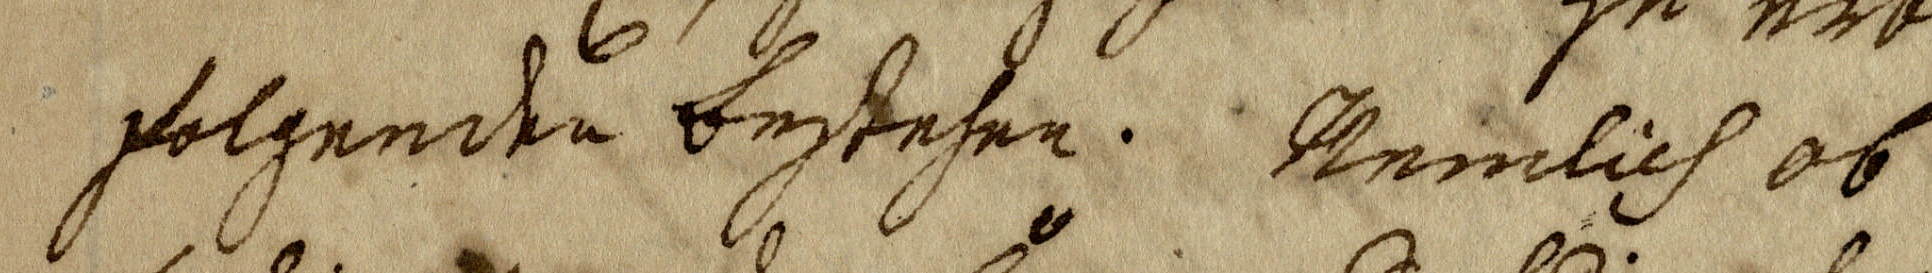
folgenden bestehen. Nemlich ob
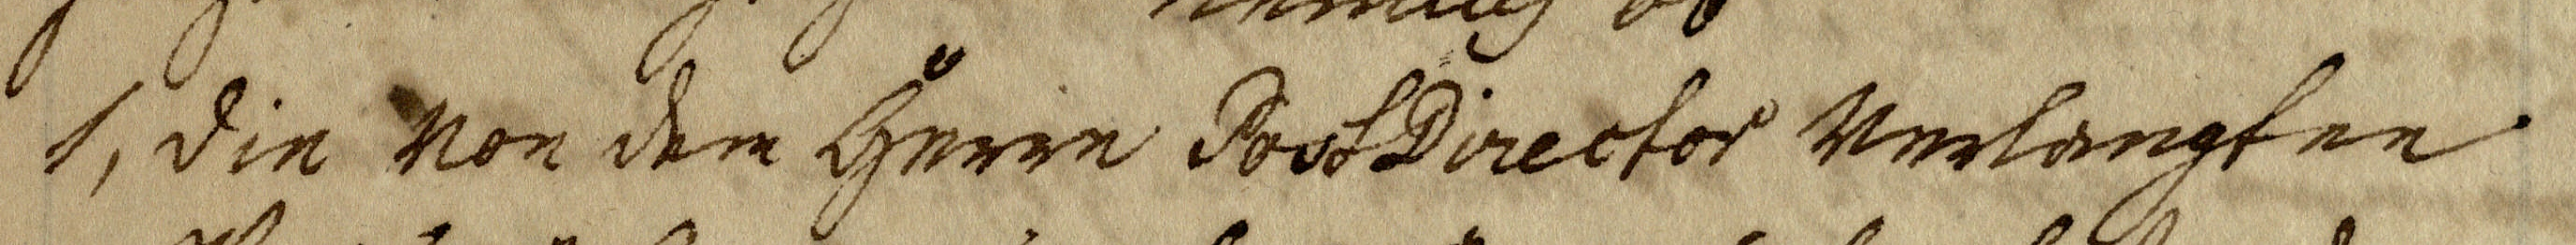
1, die von dem Herrn Prof Director verlangten
